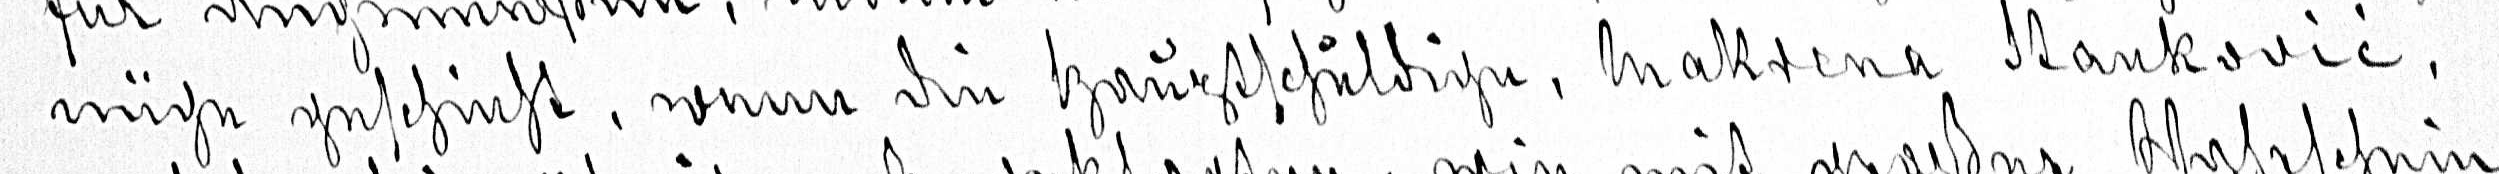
nüge geschieht, wenn die Hauptschuldige, Makrena Skanković,
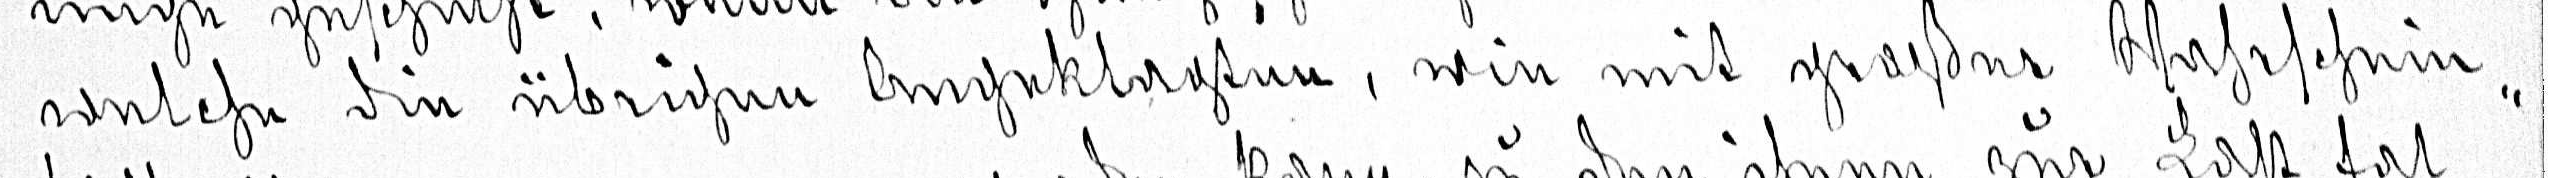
welche die übrigen Angeklagten, wie mit großer Wahrschein¬
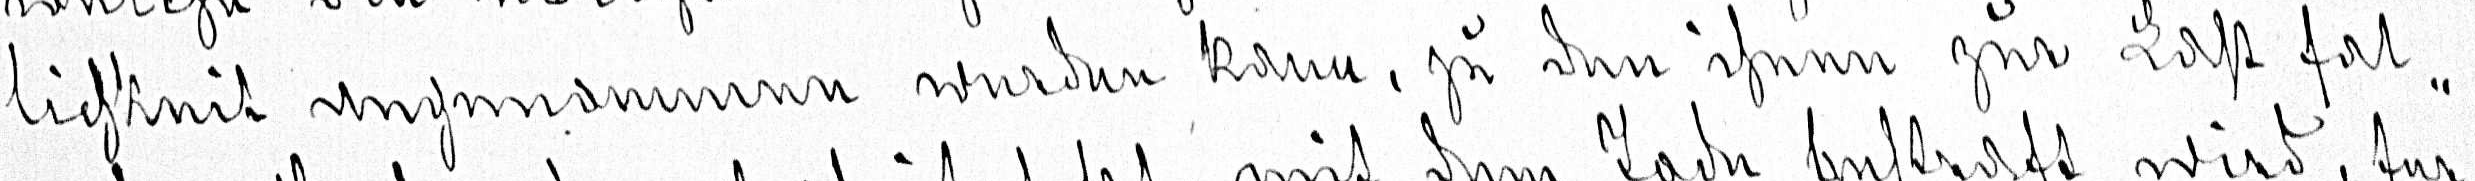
lichkeit angenommen werden kann, zu den ihnen zur Last fal¬
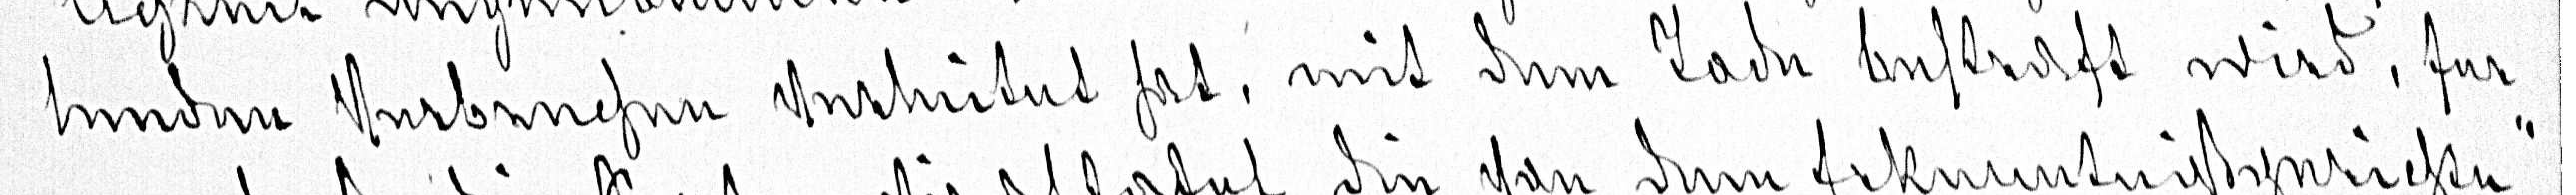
lenden Verbrechen verhütet hat, mit dem Tode bestraft wird, fer¬
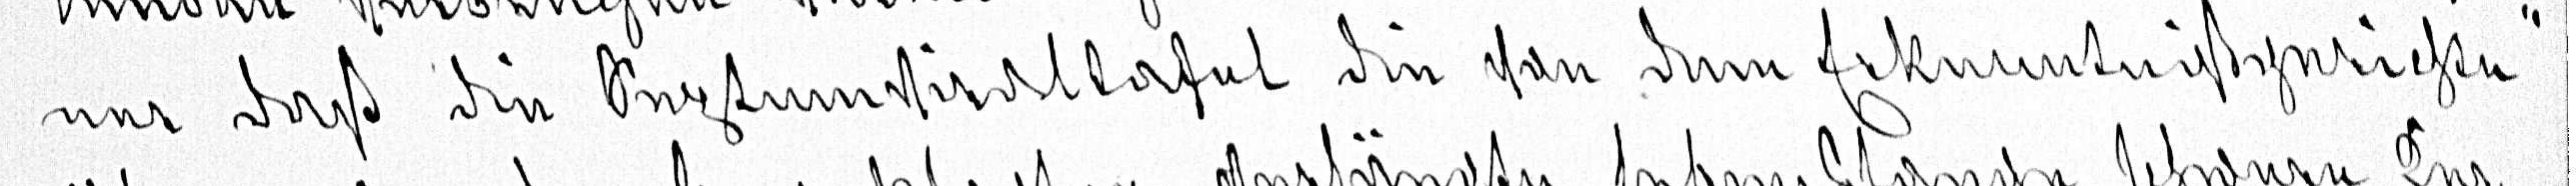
ner daß die Septemviraltafel die von dem Erkenntnißgerichte
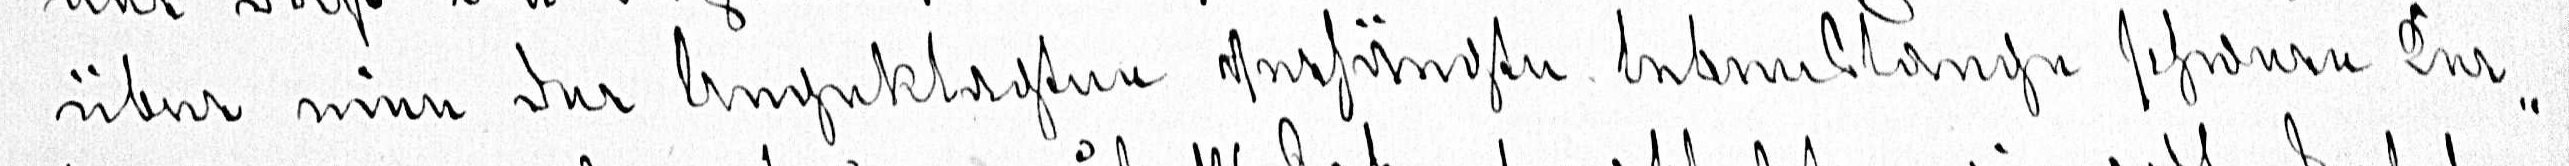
über eine der Angeklagten verhängten lebenslange schwere Ker¬
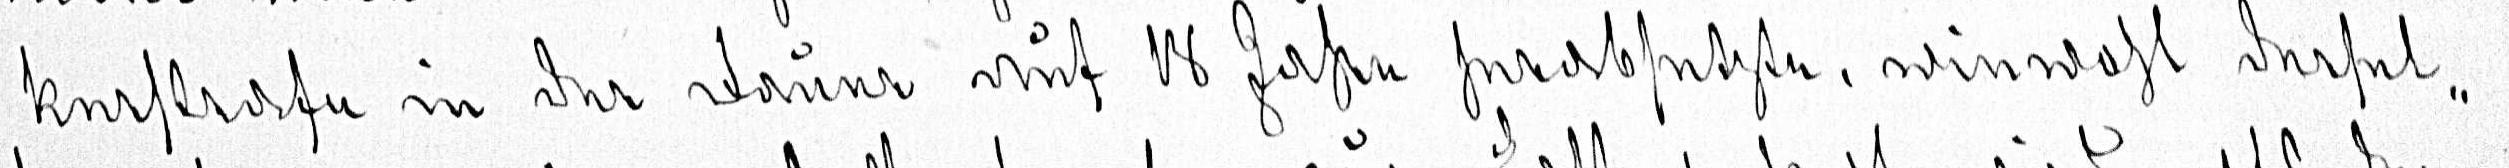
kerstrafe in der Dauer auf 18 Jahre herabsetzte, wiewohl dersel¬
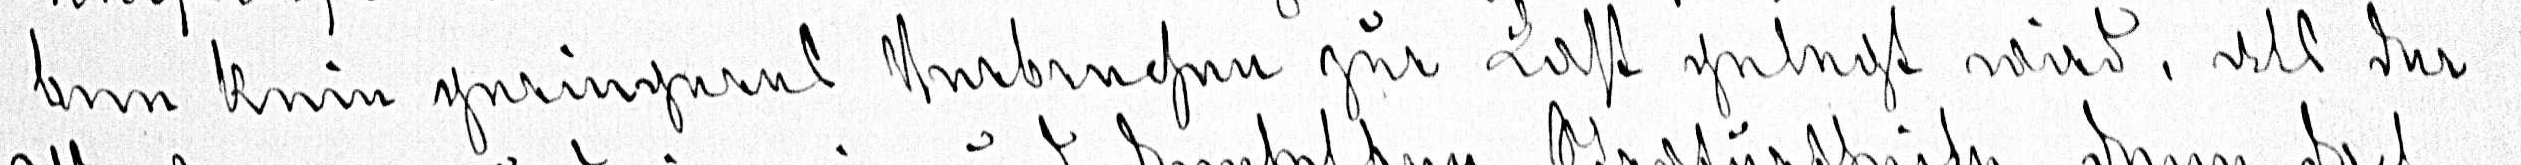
ben kein geringeres Verbrechen zur Last gelegt wird, als der
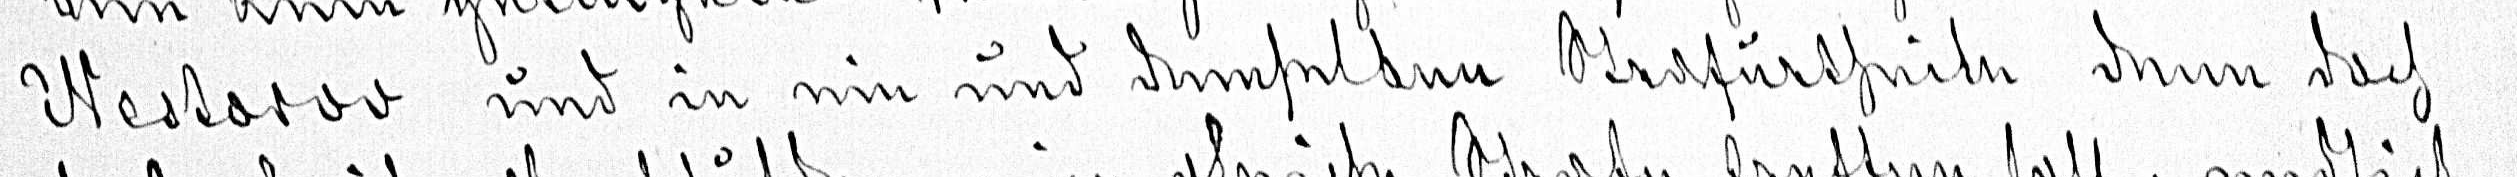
Nestorov und in ein und demselben Strafürtheile denn doch
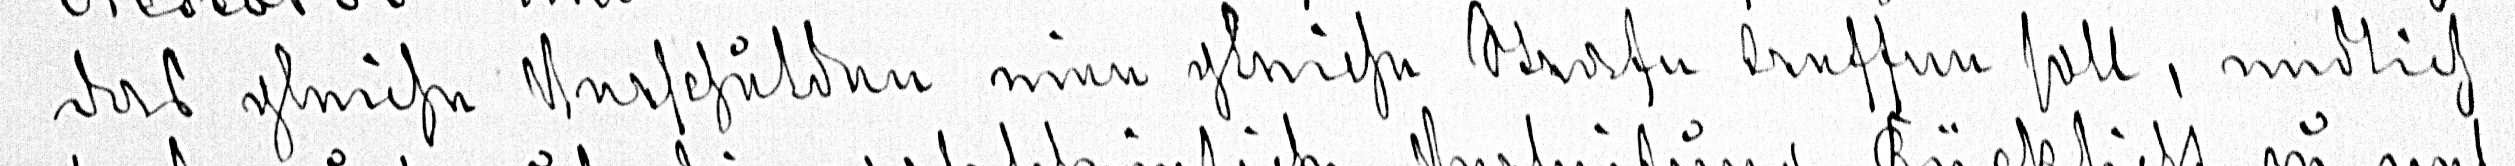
das gleiche Verschulden eine gleiche Strafe treffen soll, endlich
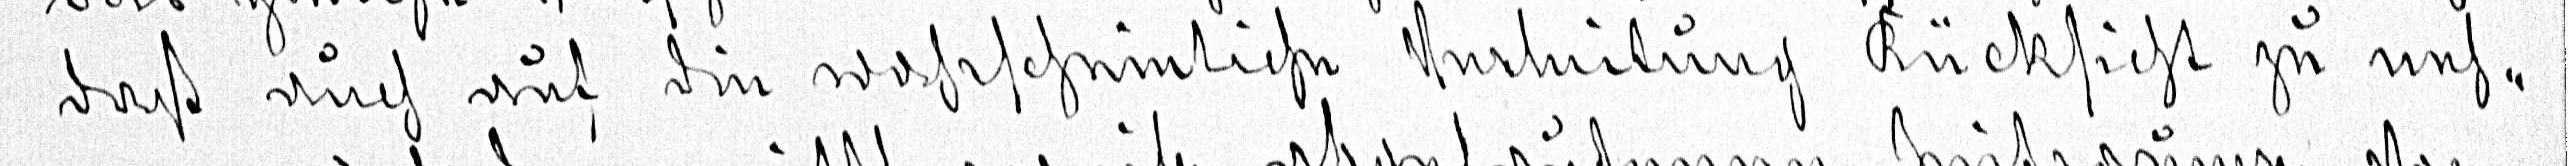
daß auch auf die wahrscheinliche Verleitung Rücksicht zu neh¬
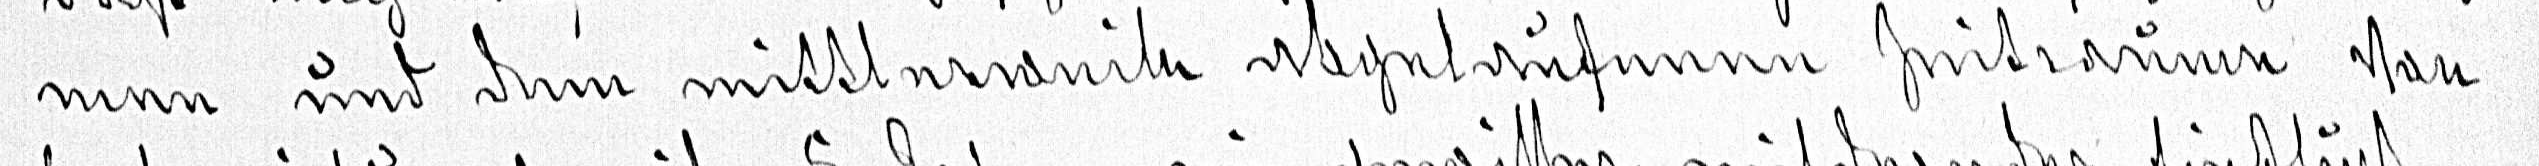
men und dem mittlerweile abgelaufenen Zeitraume von
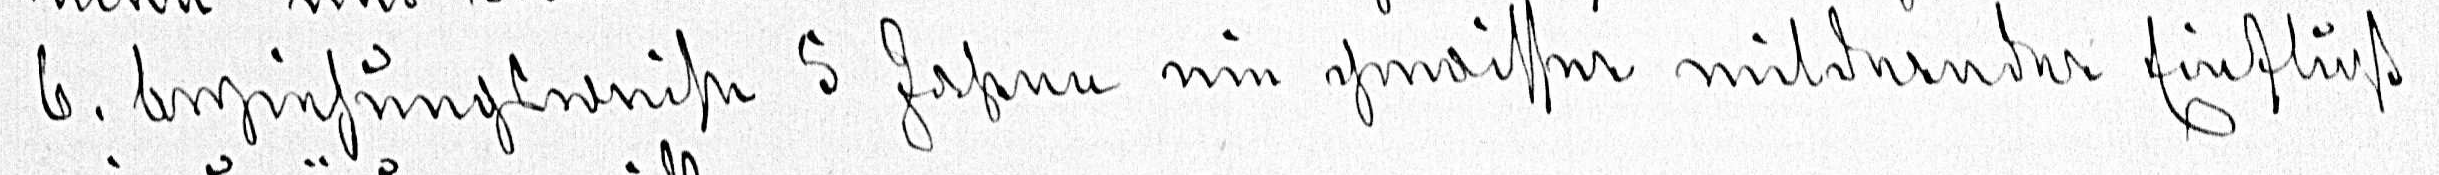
6. beziehungsweise 5 Jahren ein gewisser mildernder Einfluß
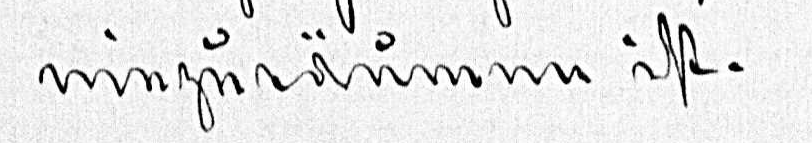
einzuräumen ist.
